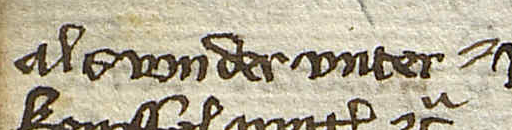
als von der vnter =
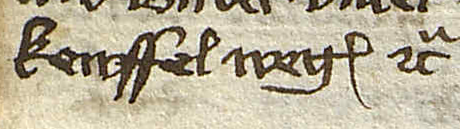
kewffel weg* ec*
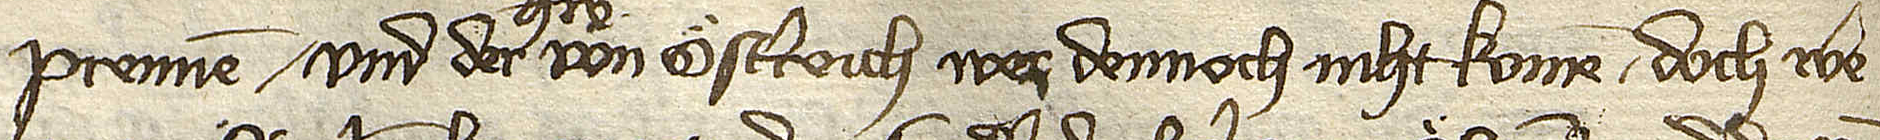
prenne* / vnd der von Öſt*reich wer dennoch niht kome* / doch w*e
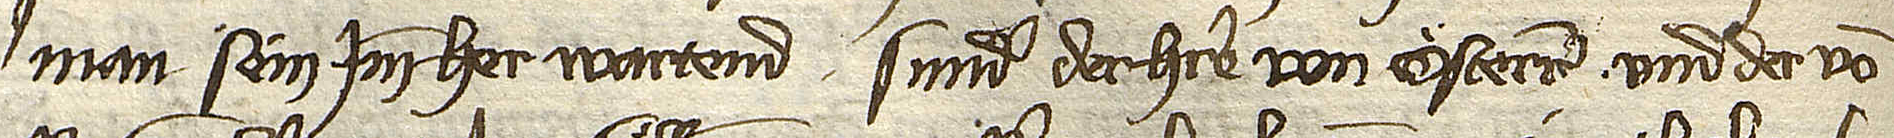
man ſein Im* her wartend / ſund* der h*re von Öſterr* vnd der vo*
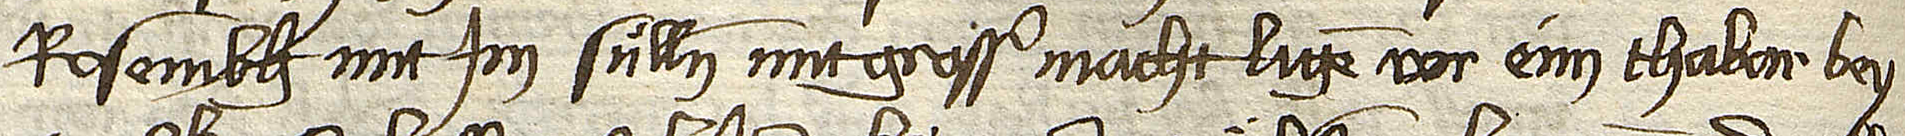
Roſemb*g mit Im ſülln* mit groſſ* macht lige* vor eim thabar bey
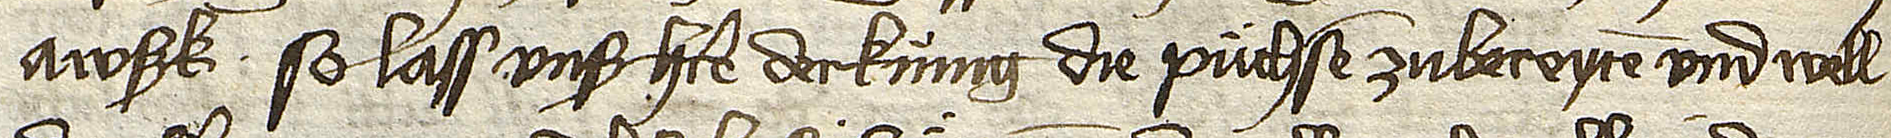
awſʒk . ſo laſſ vnſ* h*re der künig die püchſe* ʒubereyte* vnd well
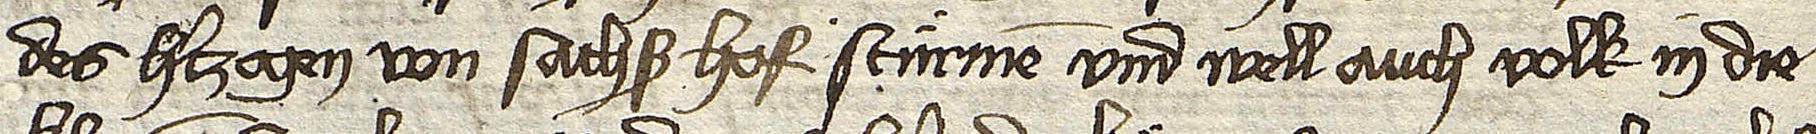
des h*cʒogen von ſachſ*hof ſtürme* vnd well auch volk in die
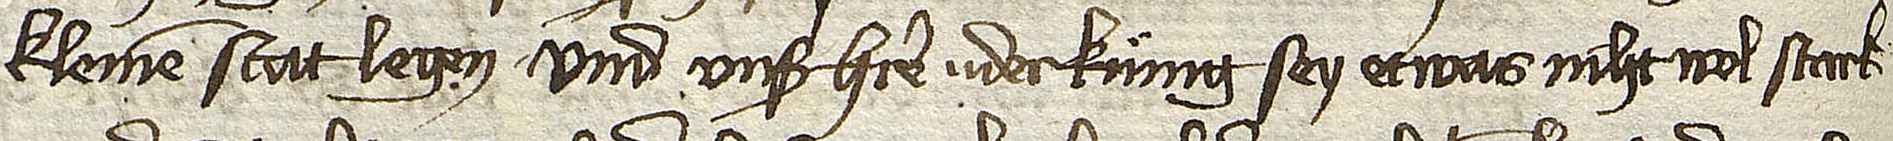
kleine* ſtat legen / vnd vnſ* h*re ~ der künig ſey etwas niht wol ſtark
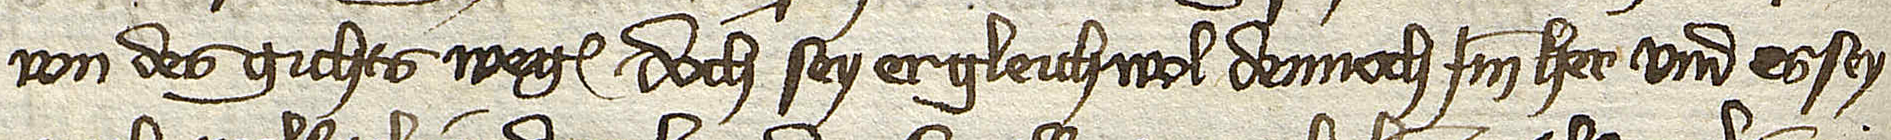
von des gichts weg* / Doch ſey er gleichwol dennoch Im* her vnd es ſey
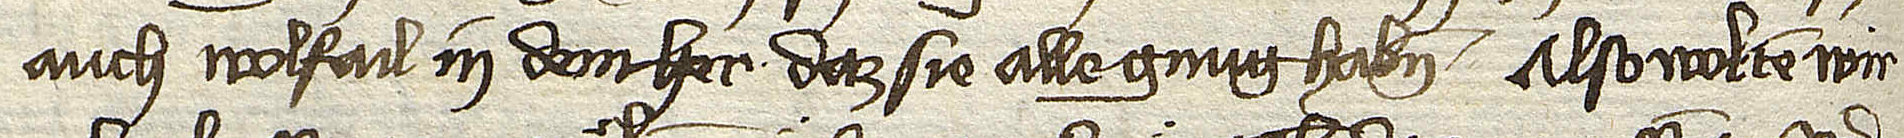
auch wolfail in dem her . daʒ ſie alle gnug habn* / Alſo wolte* wir
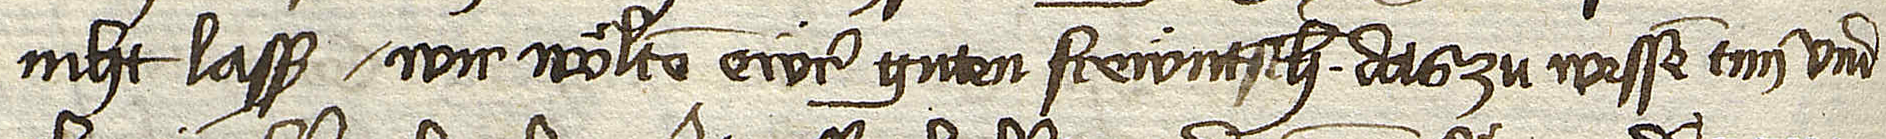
niht laſſ* / wir wölte* eẅr* guten freẅntſch* . das ʒu weſſe* tun vnd
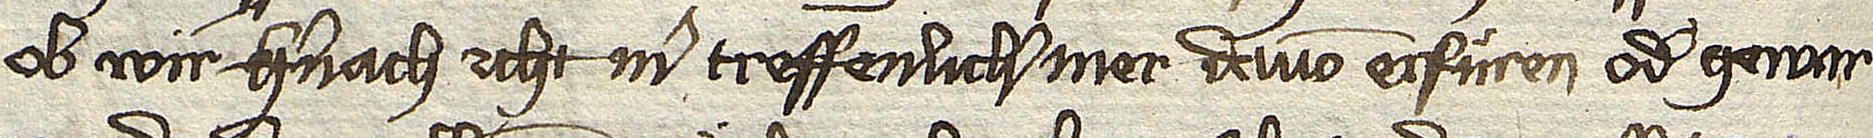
ob wir h*nach icht m* treffenlich* mer dauo* erfüren od* gewar
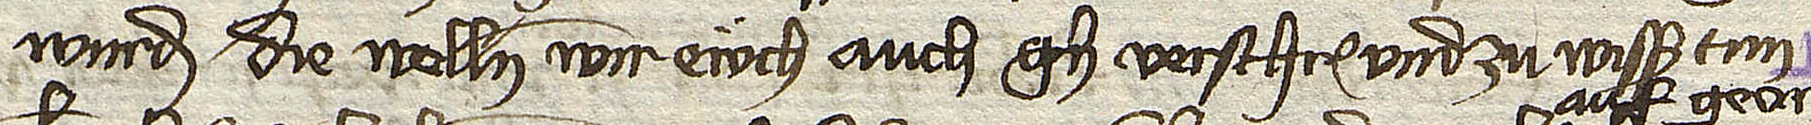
wurd* / die welln* wir eẅch auch g*n verſchr* vnd ʒu wiſſ* tun
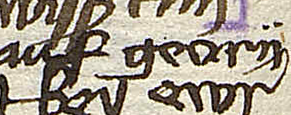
auf georii
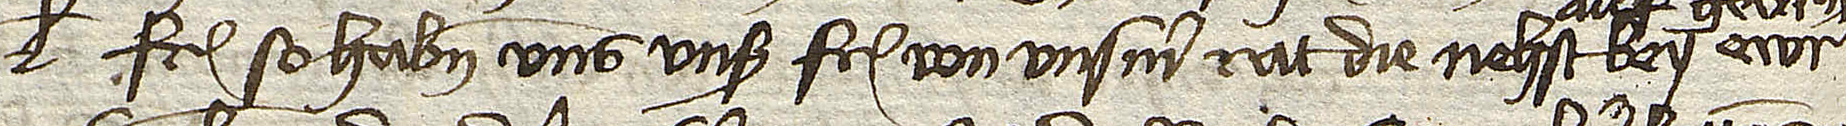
L* fr* ſo habn* vns vnſ* fr* von vnſm* rat die nehſt bey ewr*
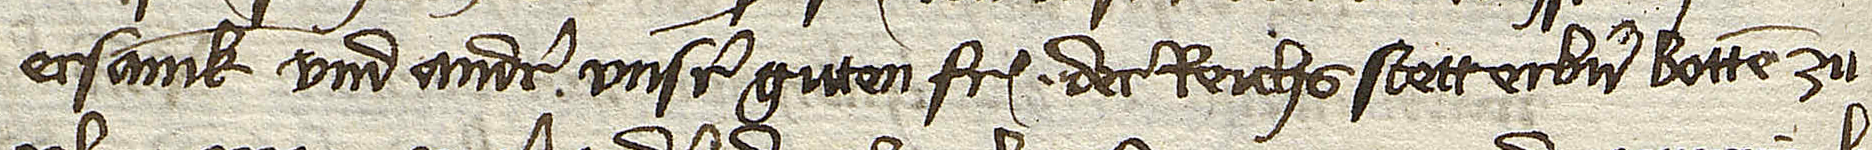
erſamk* vnd andr* vnſr* guten fr* ~ der Reichs ſtett erbn* botte* ʒu
